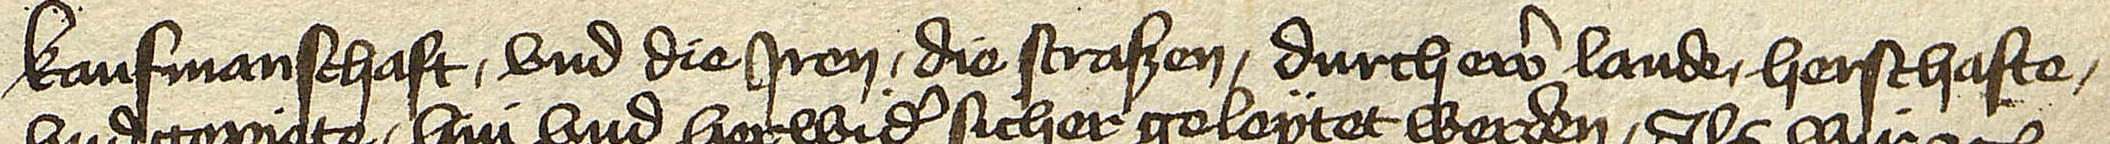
kaufmanſchaft / vnd die Iren / die ſtraſʒen / durch ew* lande / herſchafte /
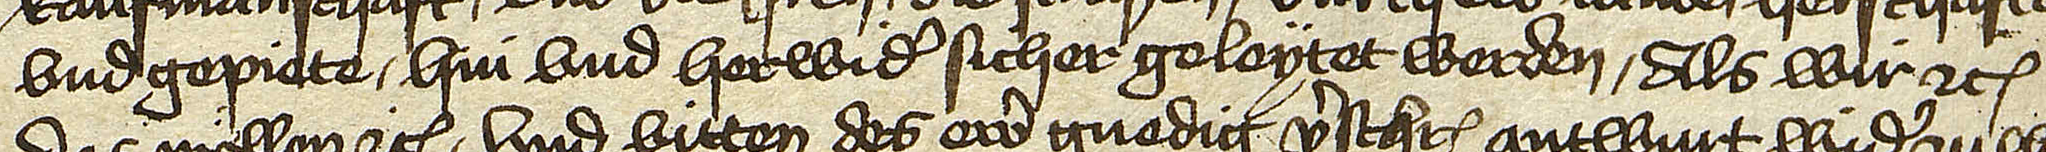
vnd gepiete / hin vnd herwid* ſicher geleytet werden / Als wir ec*
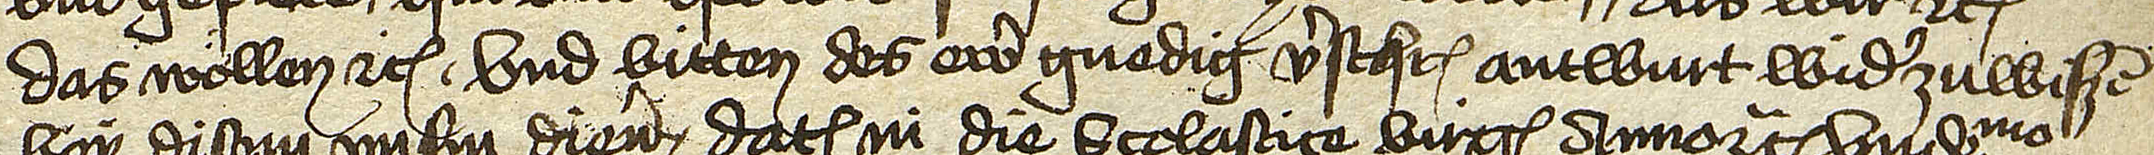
das wöllen ec* / vnd bitten des ew* gnedig v*ſchr* antwurt wid* cʒuwiſʒe*
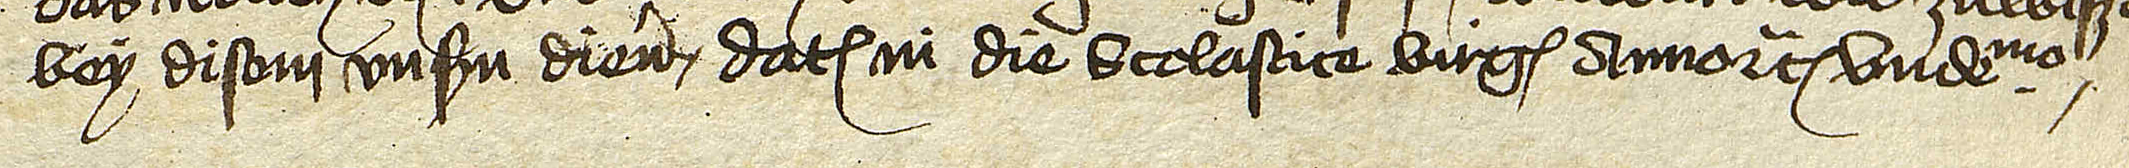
bey diſem vnſ*n dien* / dat* in die Scolaſtice virg* Anno ec* vnde* - /
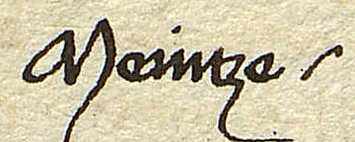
Meintʒe /
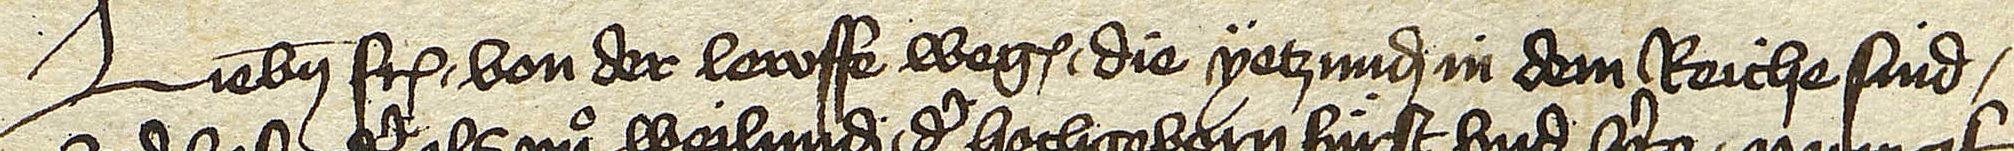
Liebn* fr* / von der lewffe weg* / die yetʒund* in dem Reiche ſind /
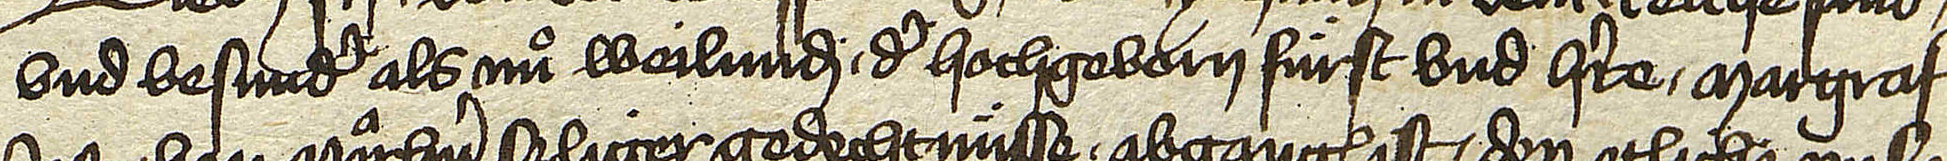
vnd beſund* als nü weilund* / d* hochgeborn* fürſt vnd h*re / Margraf
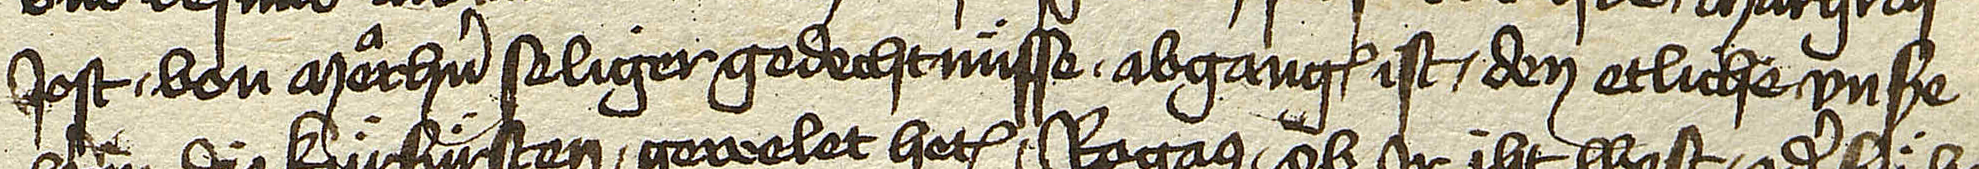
Ioſt / von Mërhn* ſeliger gedechtnüſſe / abgang* iſt / den etliche vnſ*e
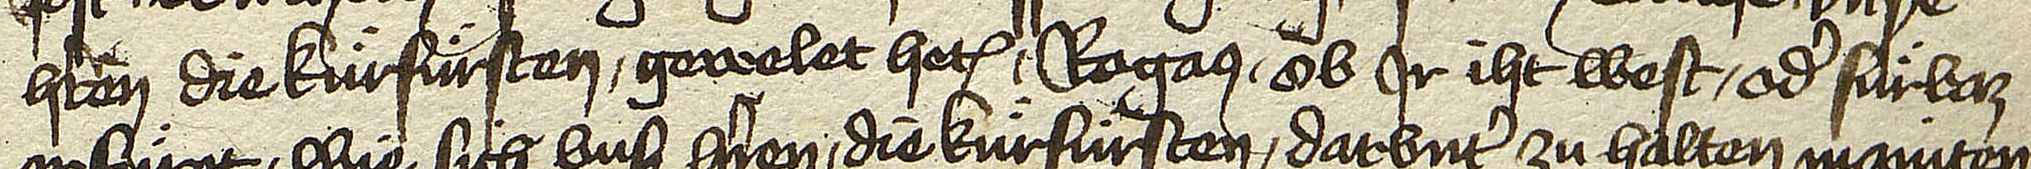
h*ren die kürfürſten/ gewelet het* / Roga* / Ob Ir iht weſt / od* fürbaʒ
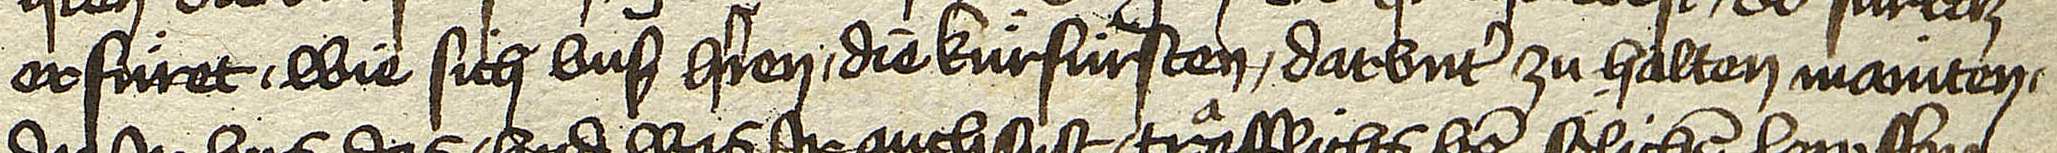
erfüret / wie ſich vnſ* h*ren / die kürfürſten / darvnt* cʒu halten mainten /
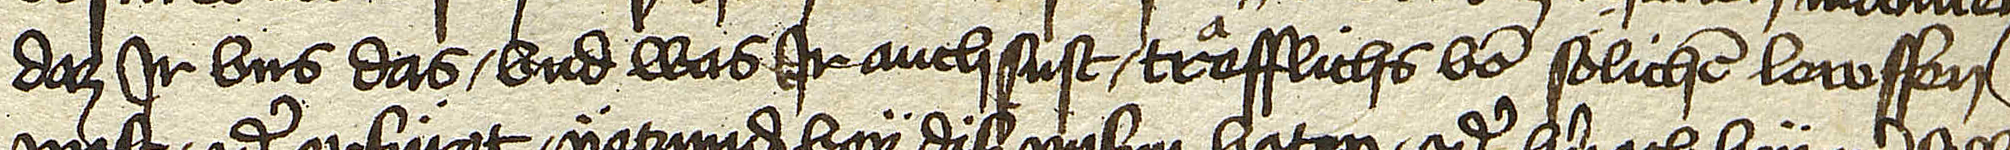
daʒ Ir vns das / vnd was Ir auch ſuſt / trëfflichs vo* ſöliche* lewffen
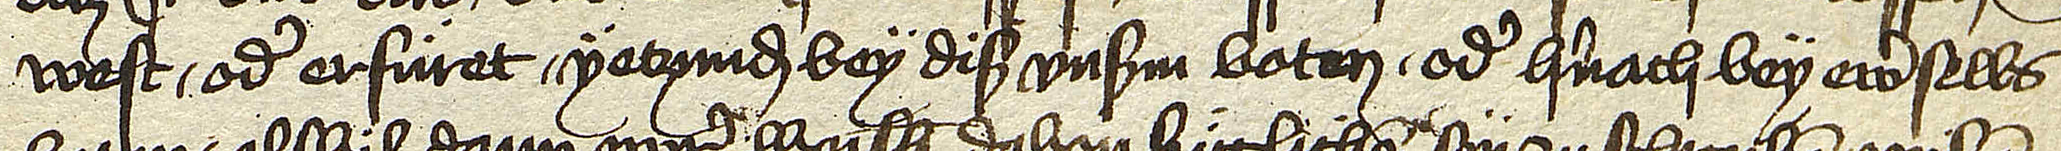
weſt / od* erfüret / yetʒund* bey diſ* vnſ*m boten / od* h*nach bey ew* ſelbs
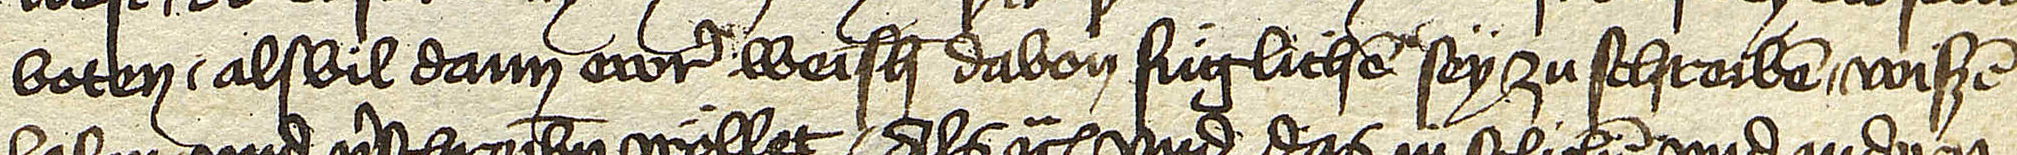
boten / alſvil dann ewr* weiſh* davon fügliche* ſey cʒu ſchreibe* / wiſʒe*
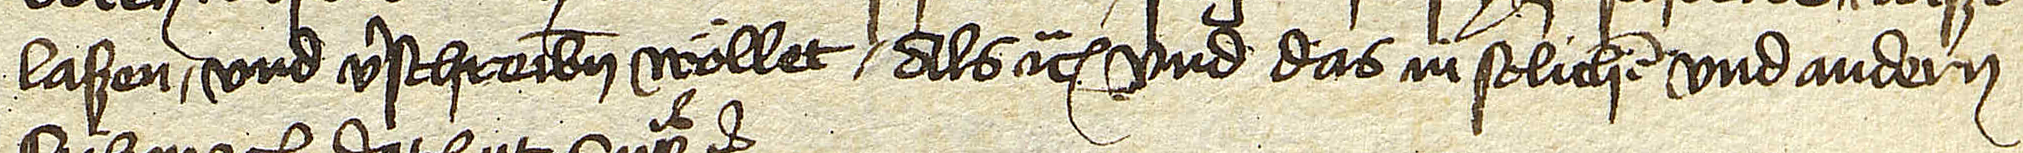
laſʒen / vnd v*ſchreibn* wöllet / Als ec* vnd das in ſoliche* vnd andern
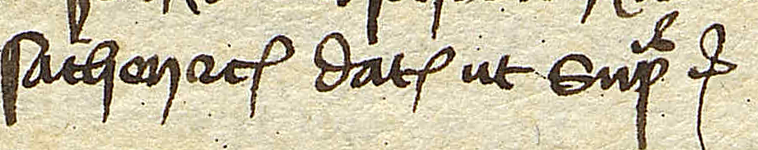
ſachen ec* dat* ut Sup* §
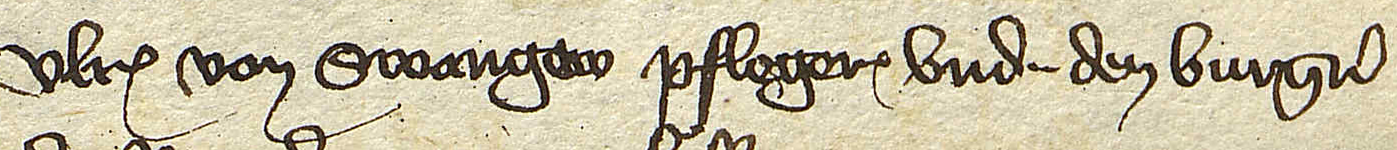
Vlr* von Swangew pfleger vnd ~ den burgn*
